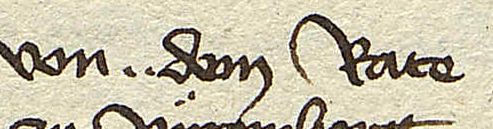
von ~ dem Rate
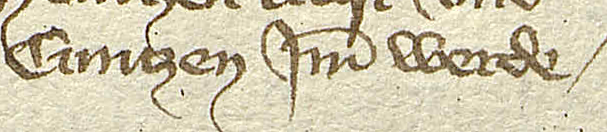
Cuncʒen Im* werde /
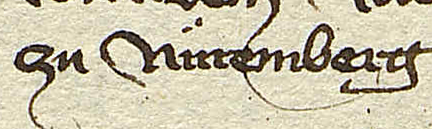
cʒu Nüremberg
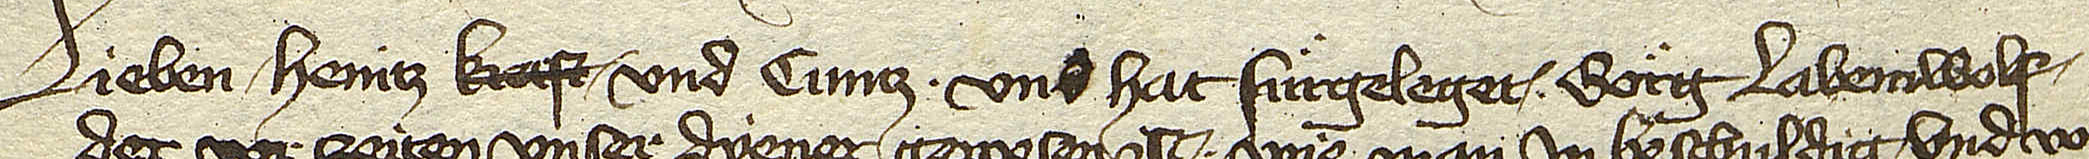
Lieben heincʒ kraft / vnd Cuncʒ vns hat fürgeleget / . Görg Labemwolf
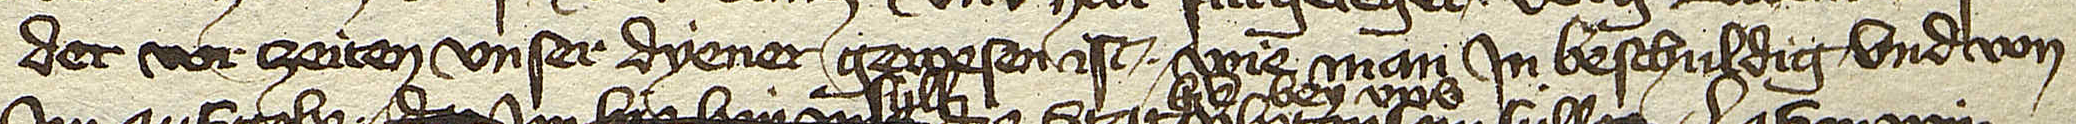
der vor cʒeiten vnſer dyener geweſen iſt / . wie man In beſchuldig / vnd von
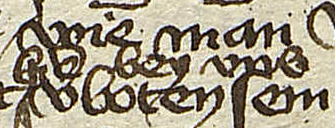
hie bey vns
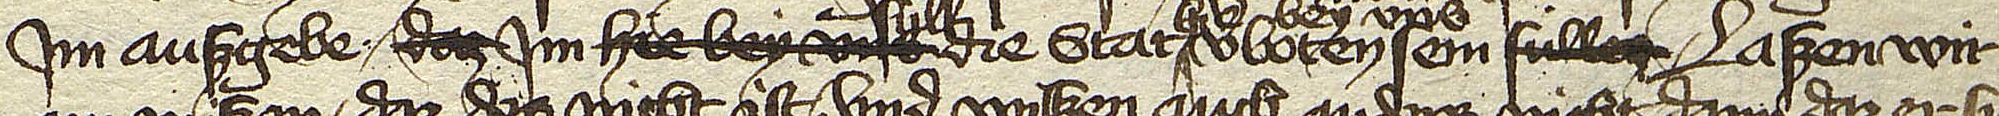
Im auſʒgebe / daʒ Im hie bey vnſs* die Stat v*boten ſein ſüllen / Laſʒen wir
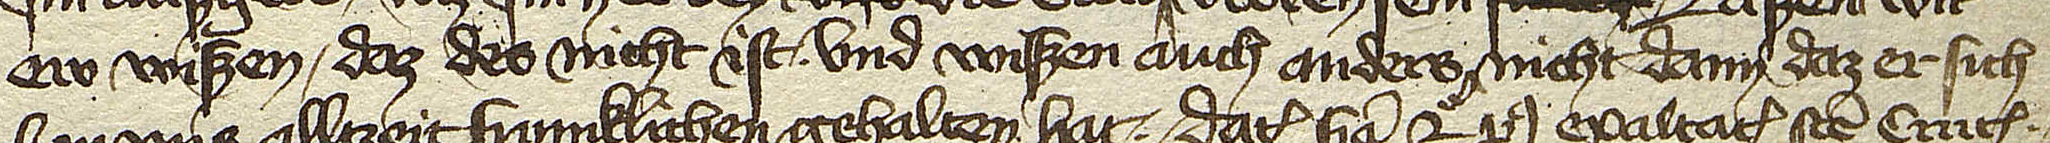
ew wiſʒen / daʒ des nicht iſt / . vnd wiſʒen auch anders nicht dann daʒ er ſich
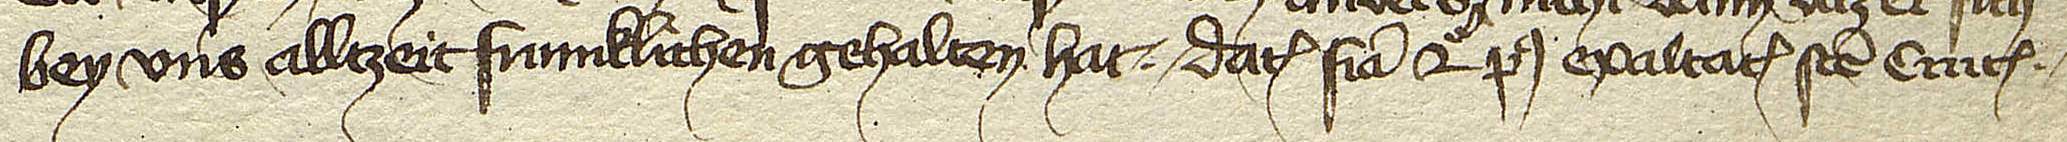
bey vns allcʒeit frumklichen gehalten hat / . dat* fia* % p* exaltat* ſce* Cruc* . /
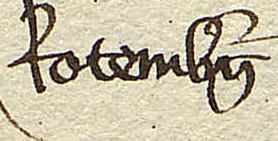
Rotemb*g
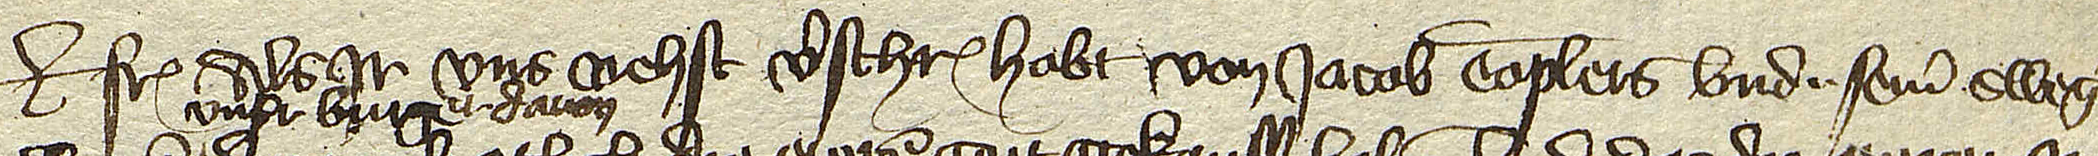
L* fr* / Als Ir vns nehſt v*ſchr* habt von Iacob Toplers vnd ~ ſein* Sweg*
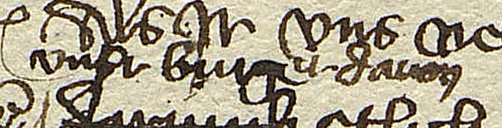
vnſ*r burger dauon
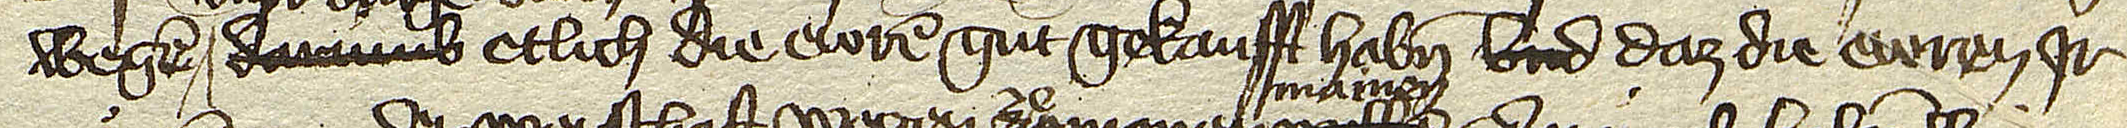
wege* darumb etlich die ewre* gut gekaufft habn* vnd daʒ die ewren Ir
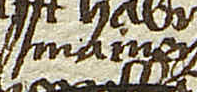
mainen
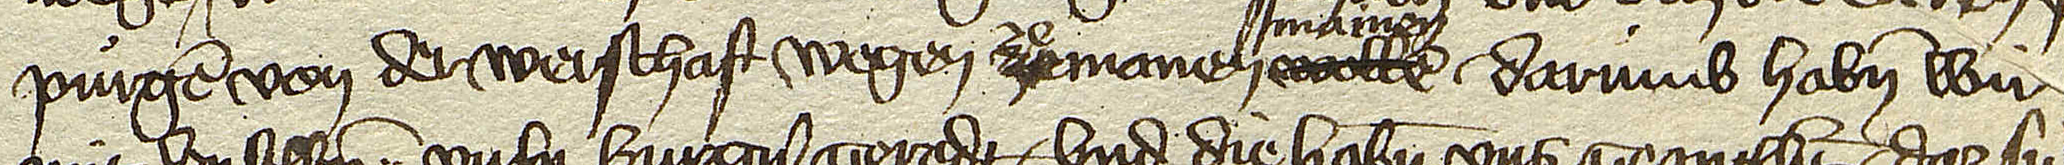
pürge* von der werſchaft wegen ʒemanen wolle* / darümb habn* wir
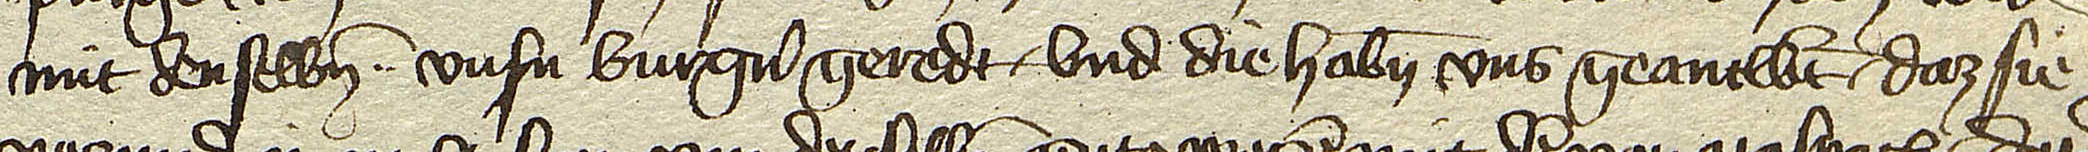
mit denſelbn* ~ vnſ*n burgn* geredt / vnd die habn* vns geantwt* / daʒ ſie
